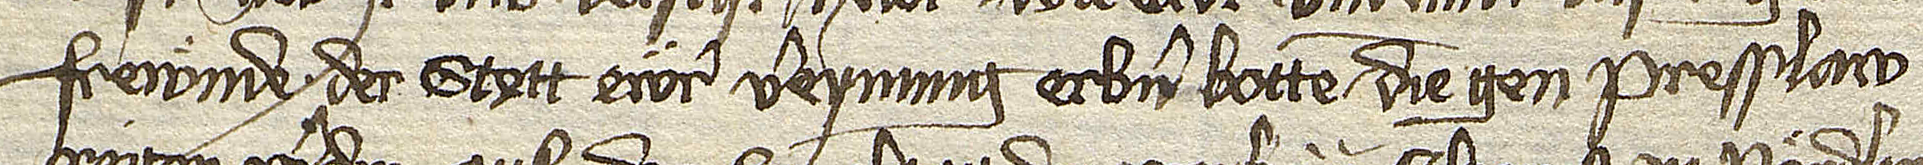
freẅnde . der Stett eẅr* v*eynung erbn* botte* / die gen Preſſlaw
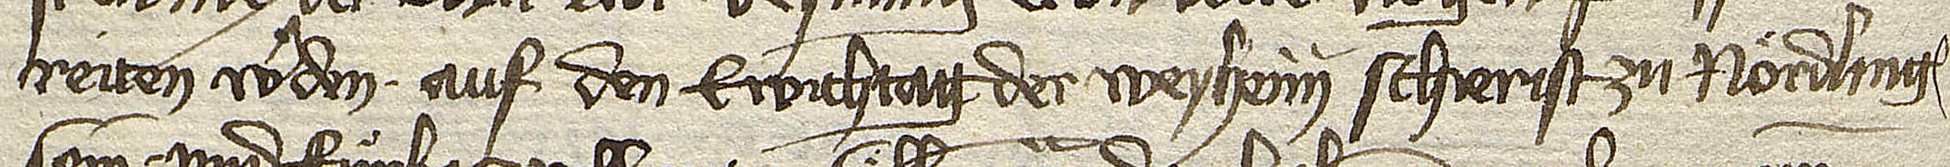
reiten w*den . auf den Ewichtag der weyheim* ſchieriſt ʒu Nördling*
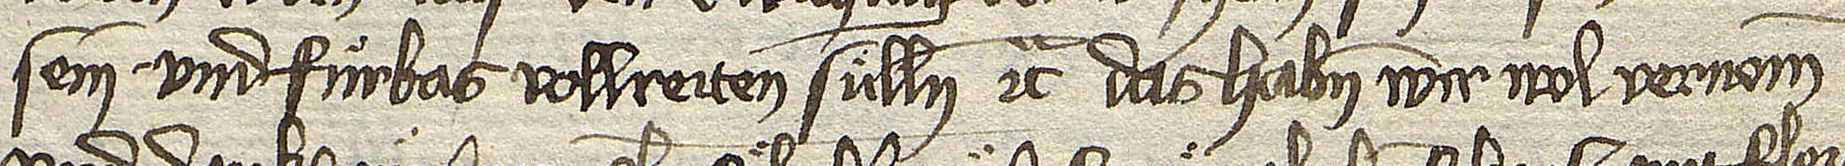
ſein / vnd fürbas vollreiten ſülln* ec* das habn* wir wol vernom*
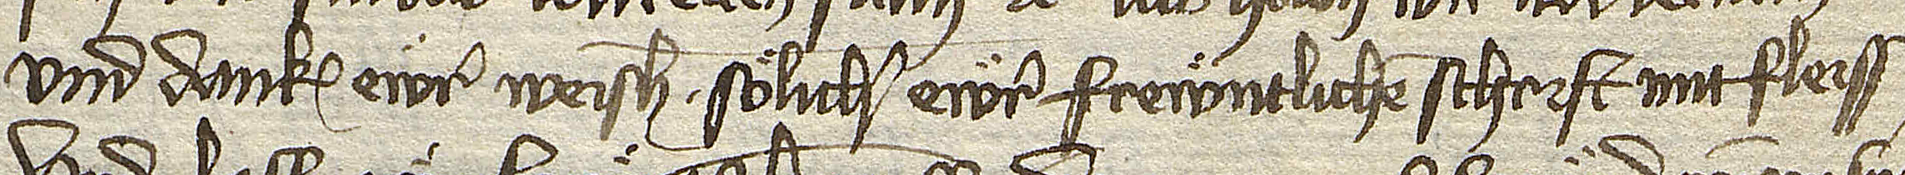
vnd dank* eẅr* weiſh* / ſölich* eẅr* freẅntliche* ſchrift mit fleiſſ
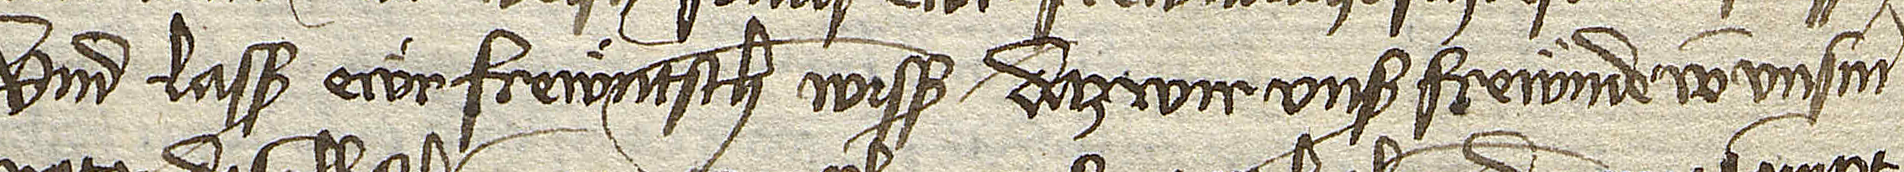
Vnd laſſ* eẅr freẅntſch* wiſſ* / Daʒ wir vnſ* freẅnde vo* vnſm*
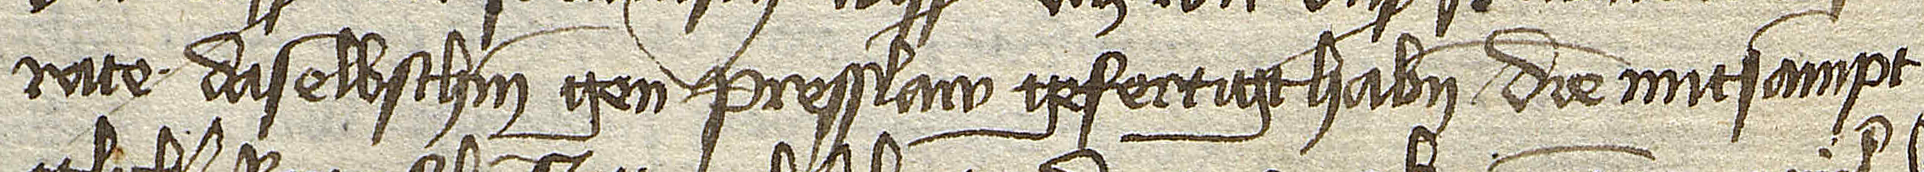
rate . daſelbſthin gen Preſſlaw gefertigt habn* / Die mitſampt
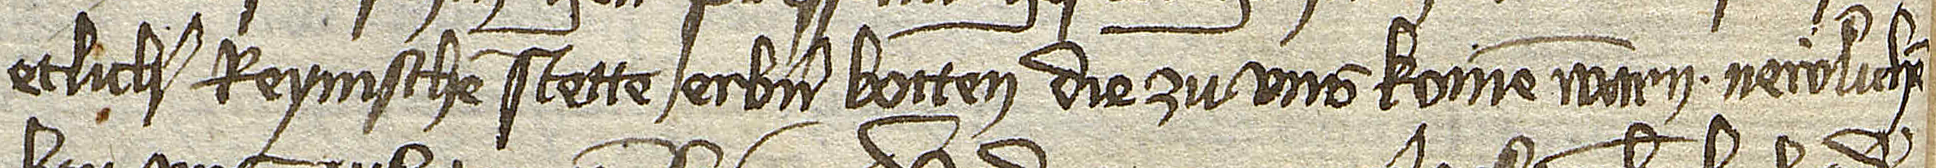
etlich* Reyniſche* ſtette erbn* botten die ʒu vns kome* warn . neẅliche*
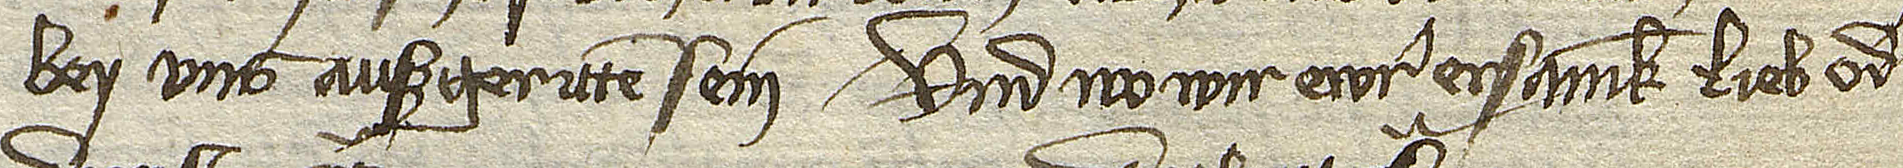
bey vns auſʒgeritte* ſein / Vnd wo wir ewr* erſamk* lieb od*
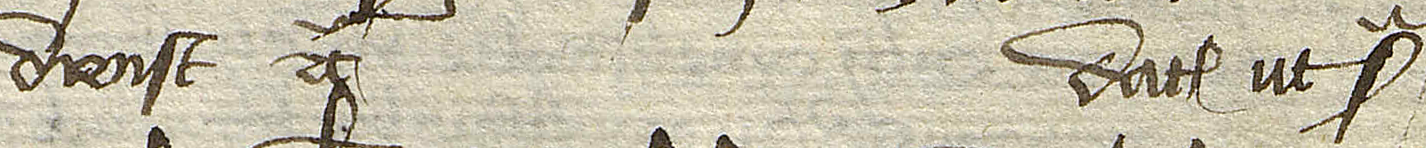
dienſt ec* Dat* ut ſ*
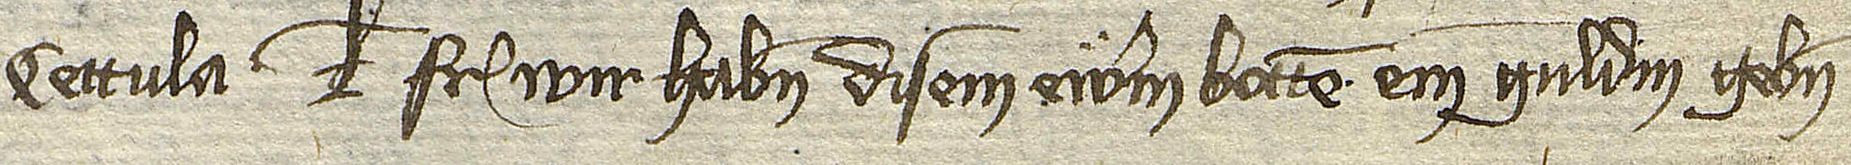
Cettula L* fr* wir habn* diſem eẅ*m botte* ein guldin gebn*
